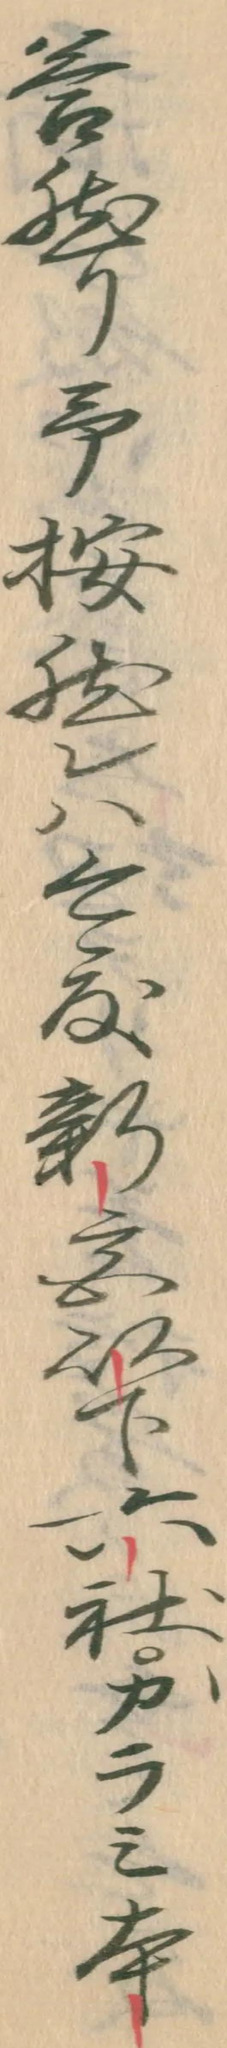答然リ予按然レハ今度新-宮以-下六-社￮カラミ本-
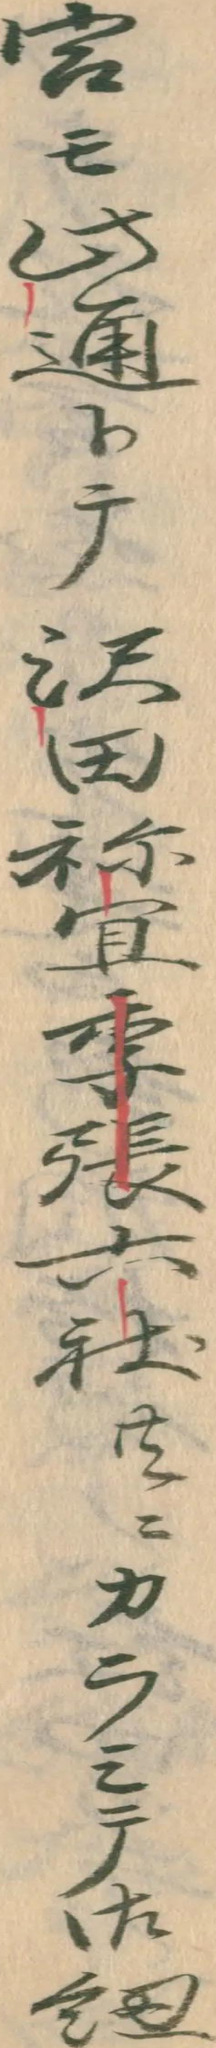宮モ此_通トテ沢_田祢-宜季張六-社共ニカラミテ御紐
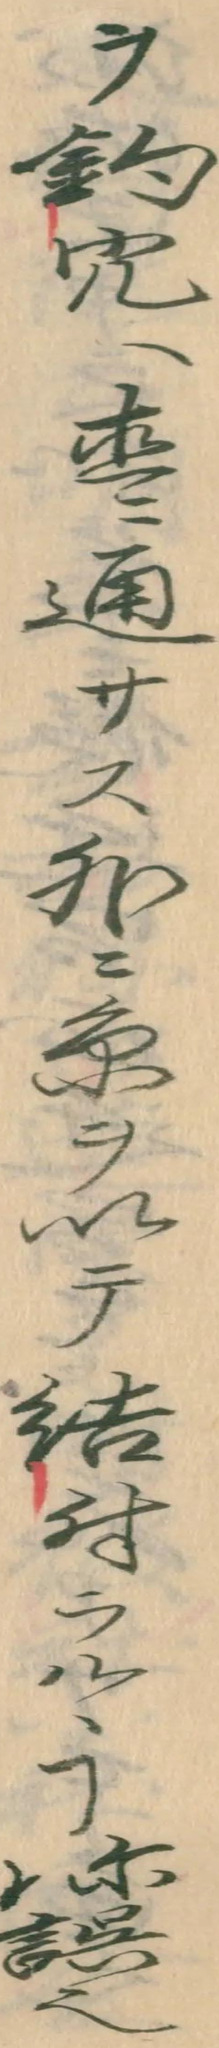ヲ釣_穴ヘ直ニ通サス外ニ糸ヲ以テ結_付ラルヽコト弥誤也
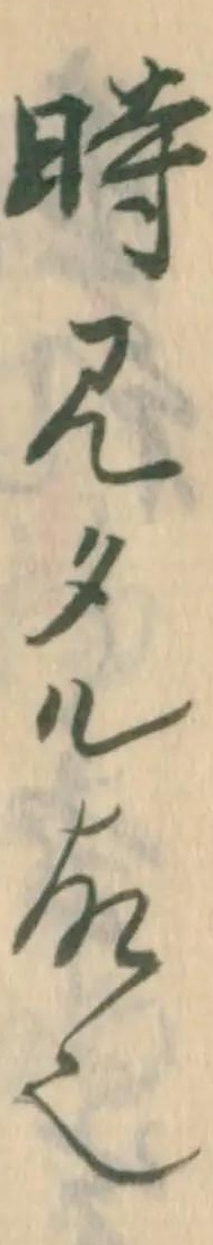時見タル故也
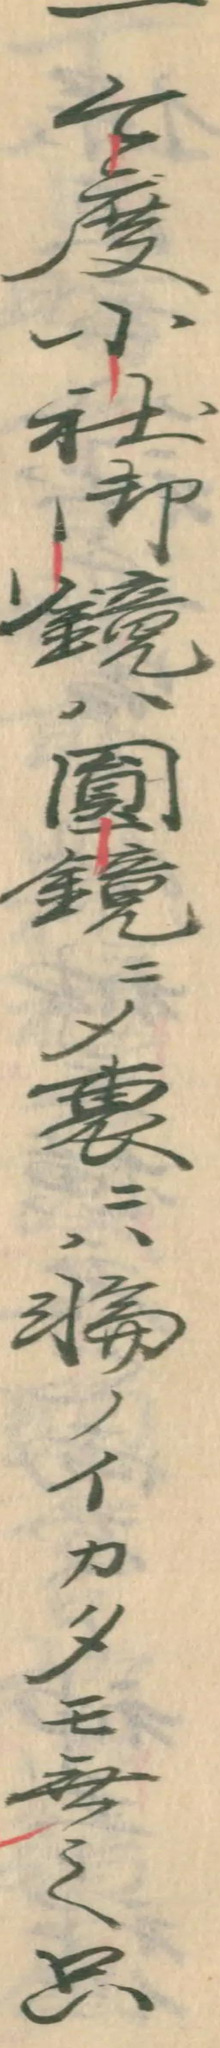一今-度小-社御_鏡ハ円-鏡ニシテ裏ニハ輪ノイカタモ無之只
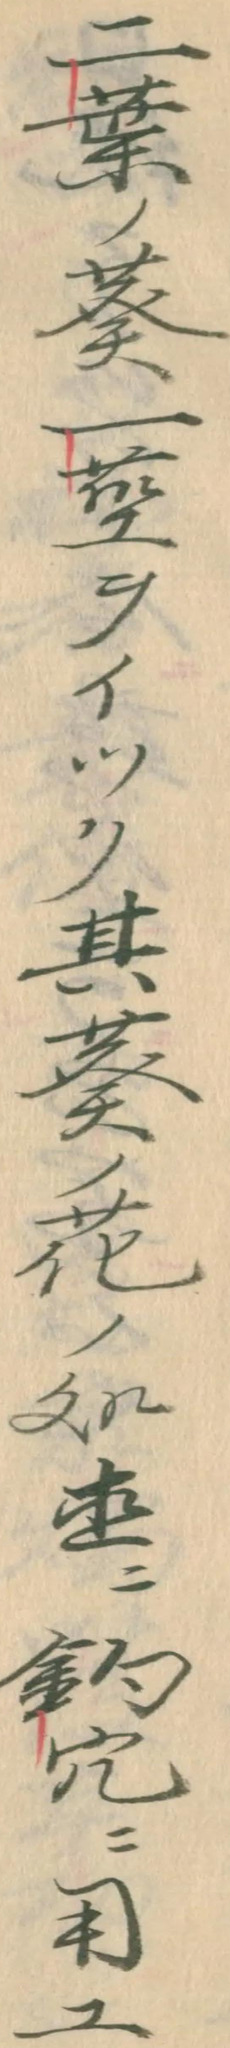二_葉ノ葵一-茎ヲイツク其葵ノ花ノ処直ニ釣_穴ニ用ユ
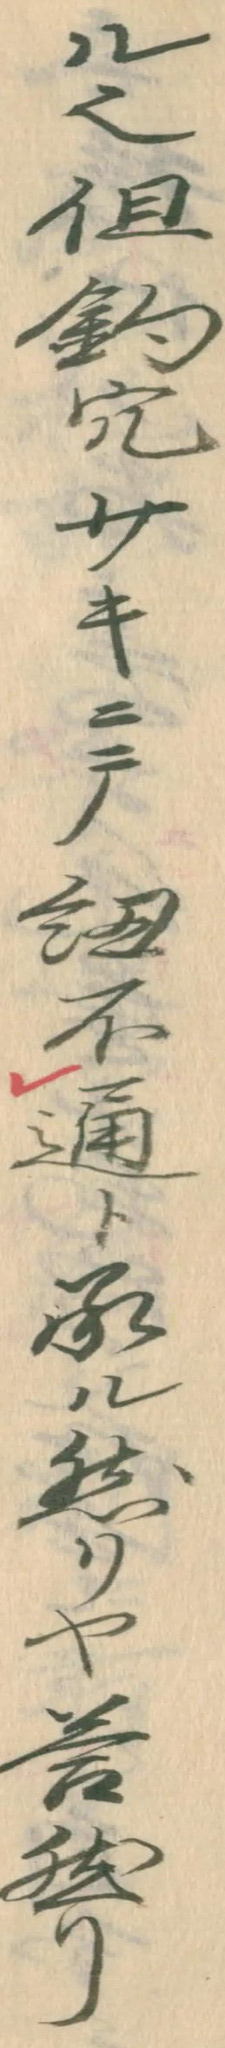ル也但釣穴少キニテ紐不通ト承ル然リヤ答然リ
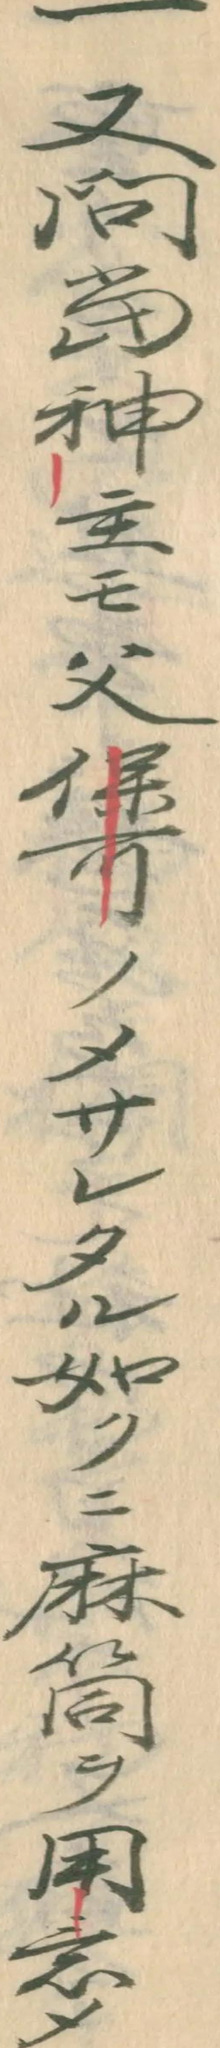一又問当神_主モ父保可ノシメサレタル如クニ麻筒ヲ用-意シテ
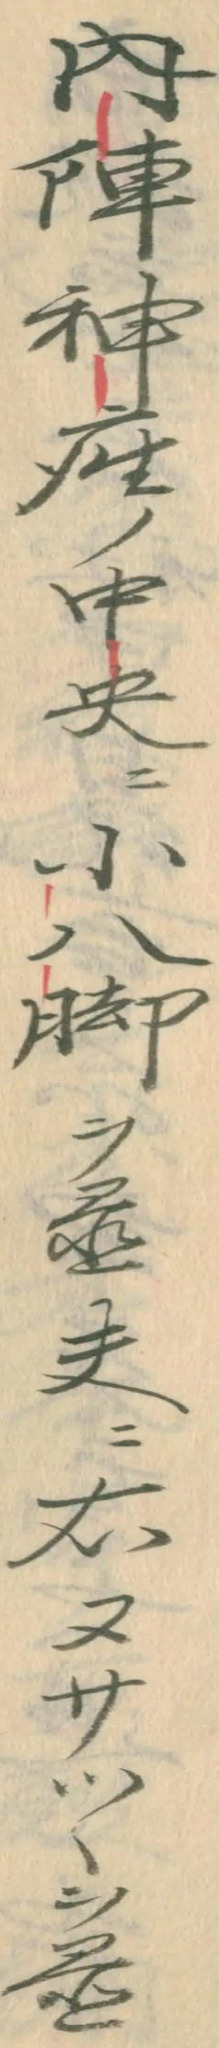内-陣神-座ノ中-央ニ小_脚ヲ置夫ニ右ヌサツヽヲ置

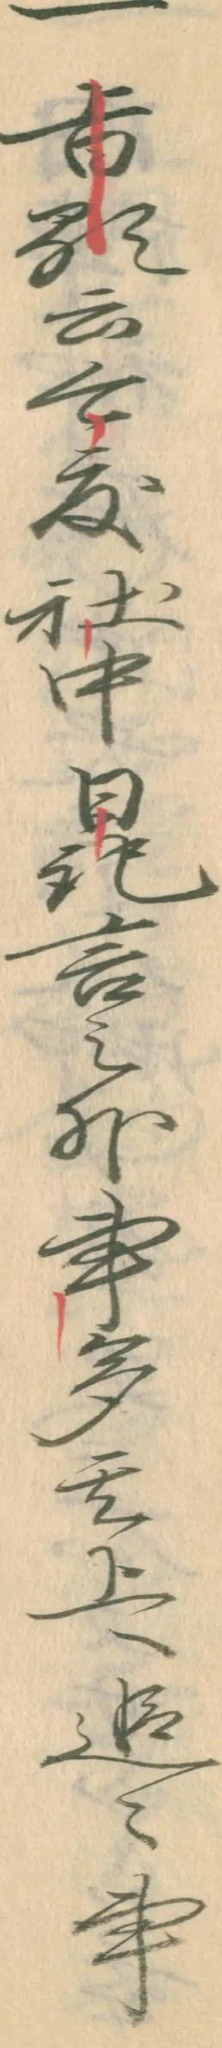一旨顕云今-度社-中日-記言之外事_多其上へ追々事
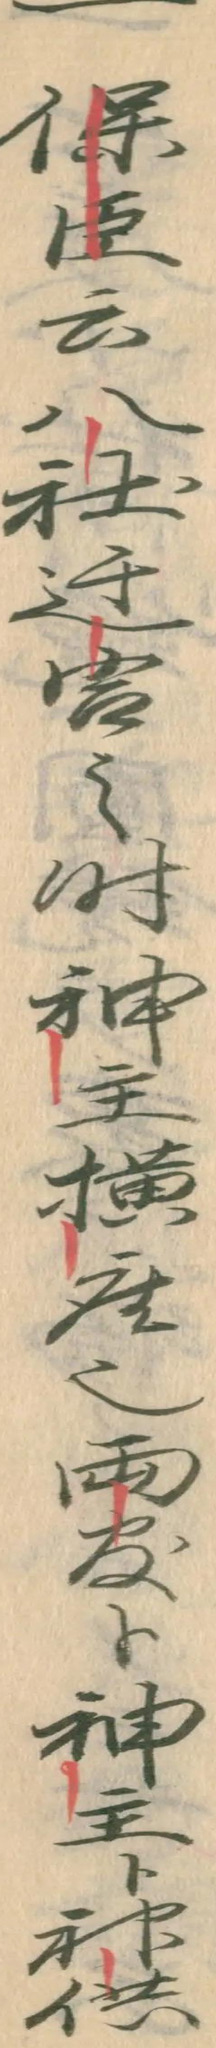一保臣云八-社迁-宮之時神_主横_座也両-官ト神_主ト神-供
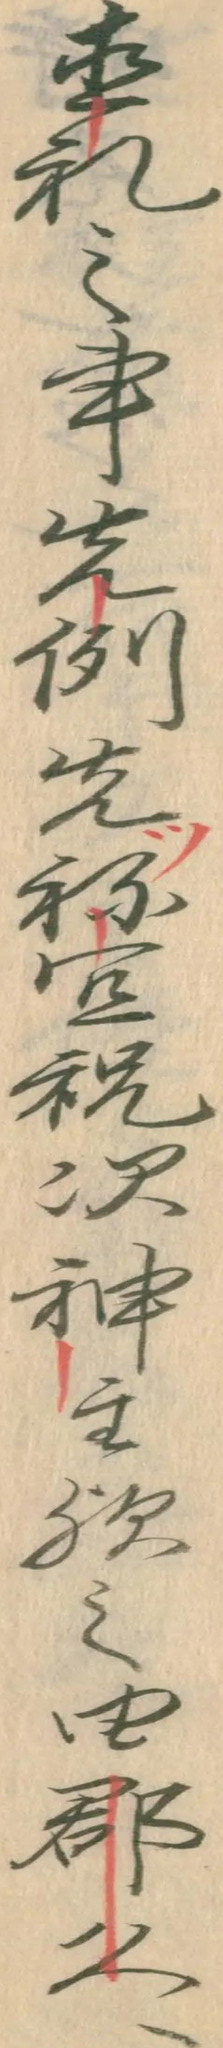直-礼之事先-例先祢-宜祝次神_主歟之由郡久ヘ
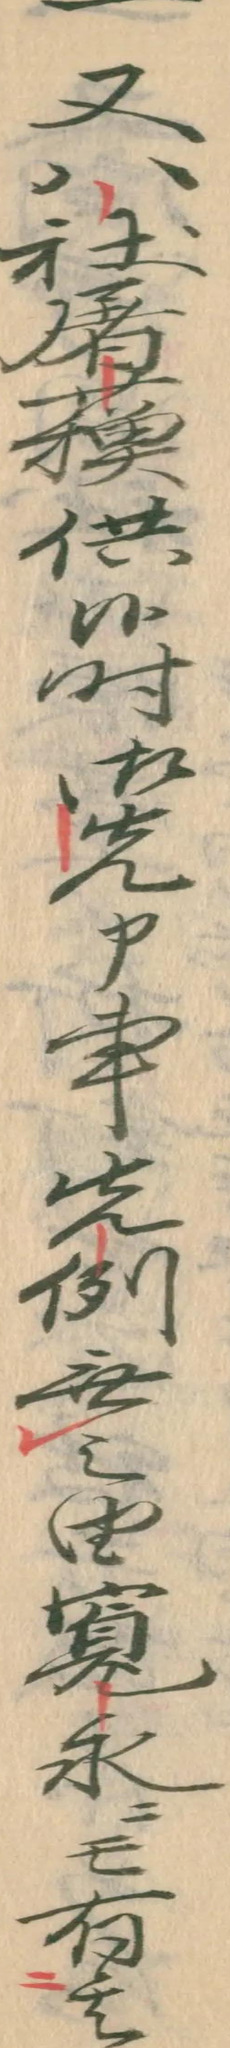一又八-社屠-蘇供候時御_先申事先-例無之由寛-永ニモ有其
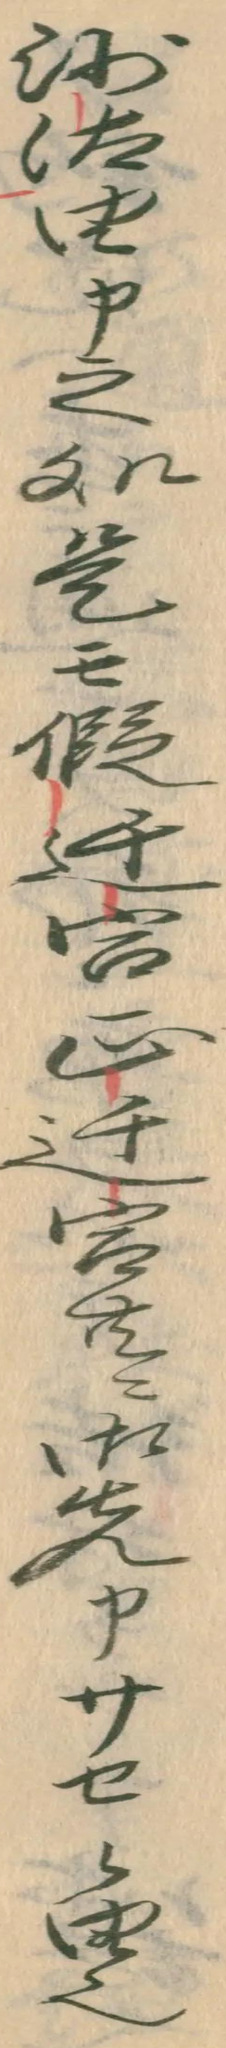沙-汰由申之処是モ仮_迁-宮正-迁-宮共ニ御先申サセ候由也
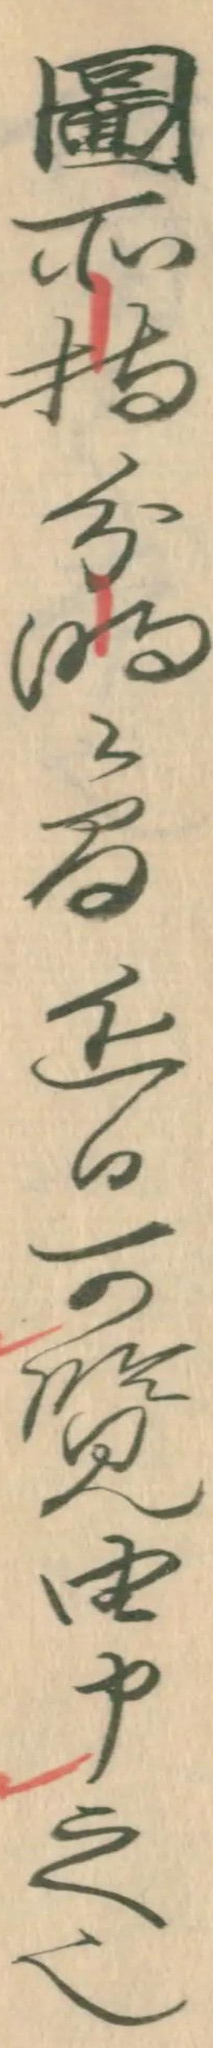図所-持分-明候間近日可覧由申之也
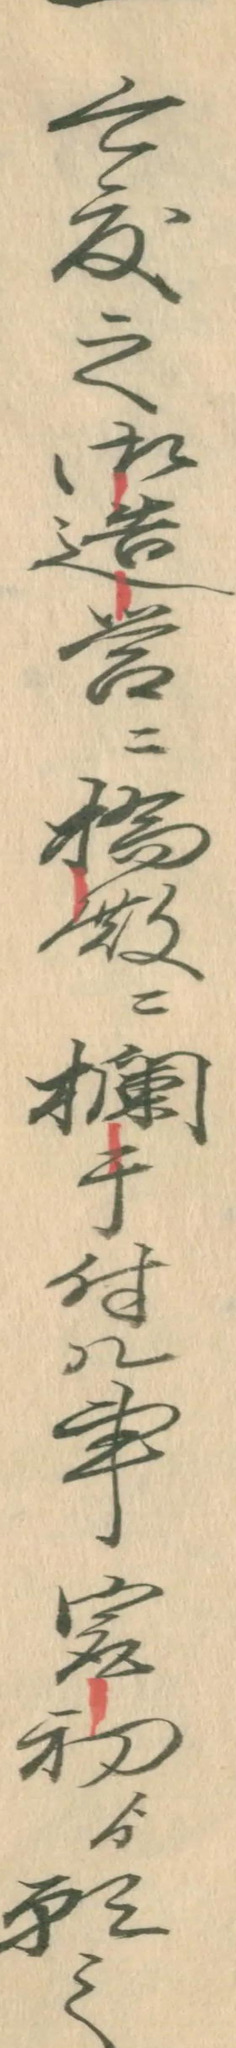一今度之御-造-営ニ橋_殿ニ欄-干付ル事最-初ゟ願之
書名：賀茂社記録. 第16冊
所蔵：国立国会図書館 National Diet Library, JAPAN
